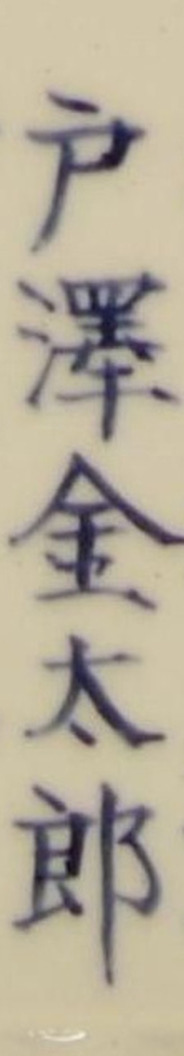戸澤金太郎
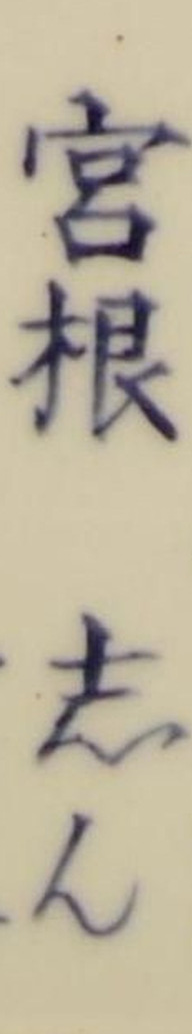宮根しん
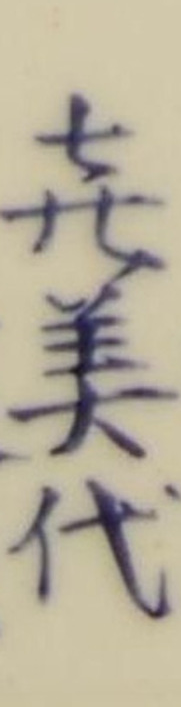喜美代

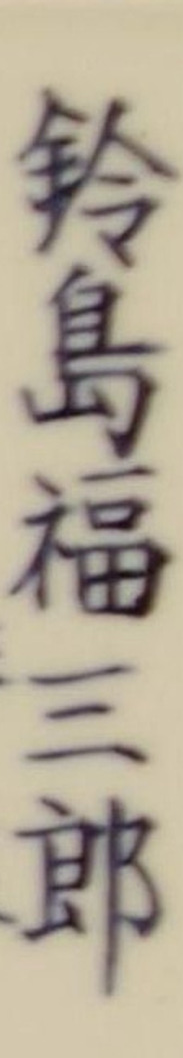鈴島福三郎
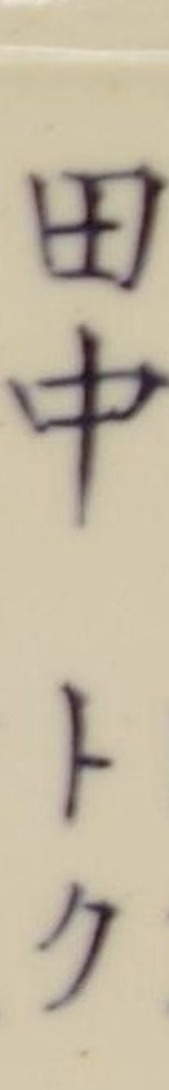田中トク
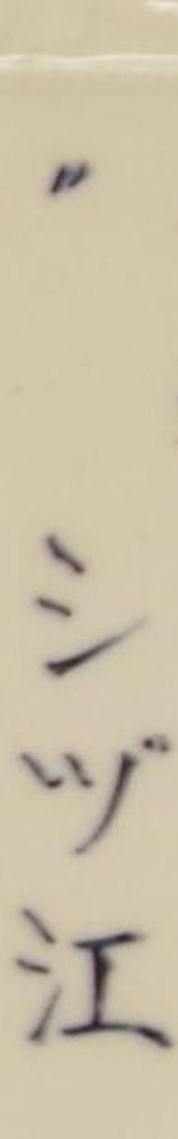シヅエ
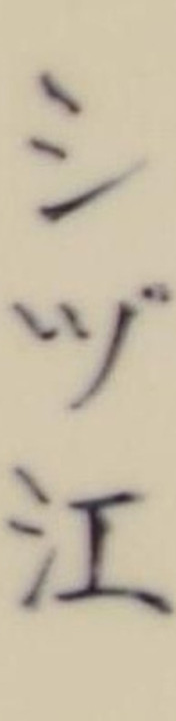シヅエ
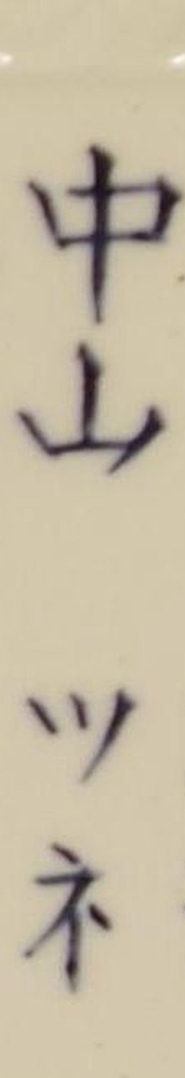中山ツネ
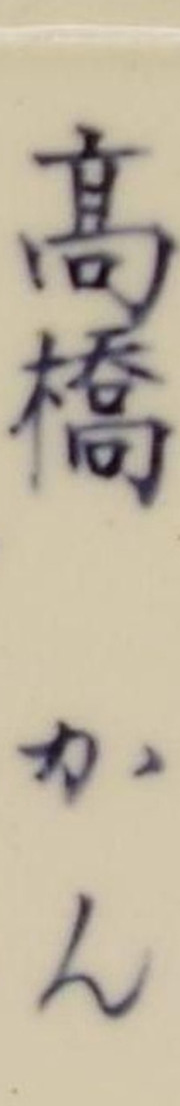高橋かん
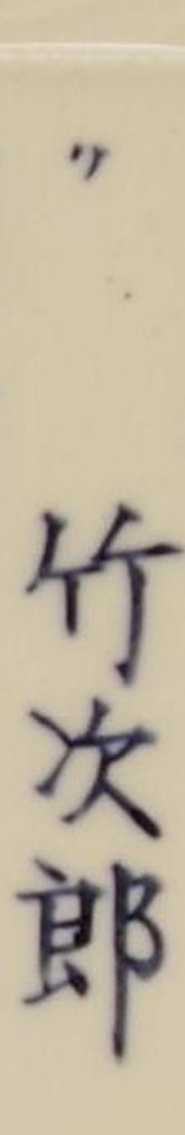竹次郎
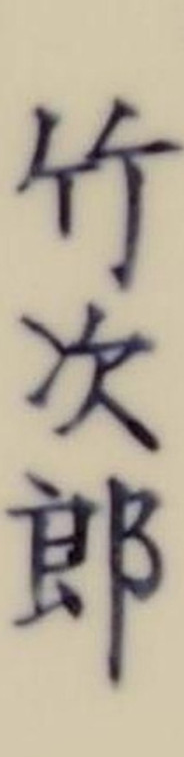竹次郎
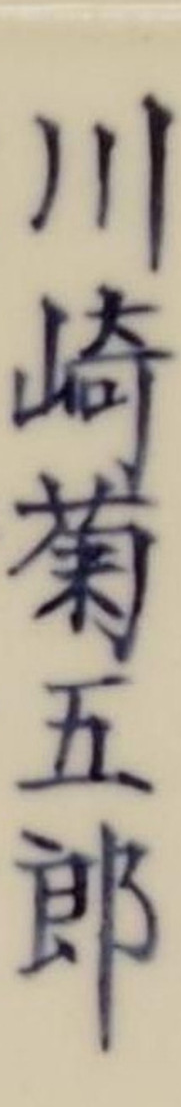川崎菊五郎
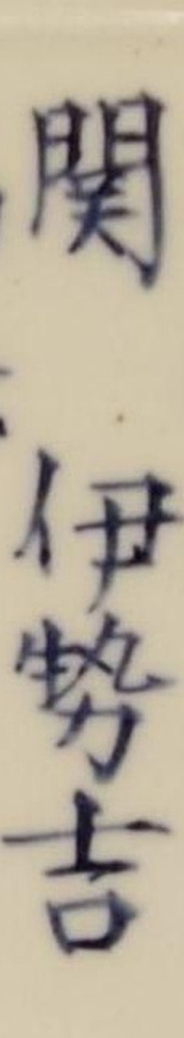関伊勢吉
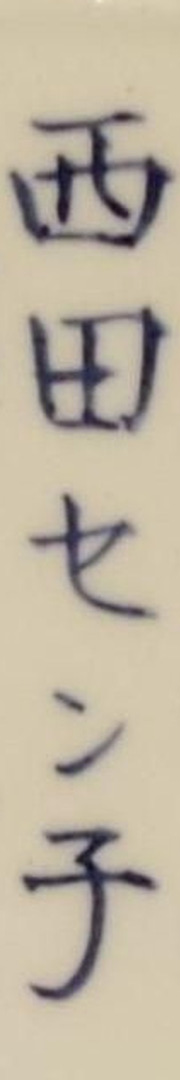西田セン子
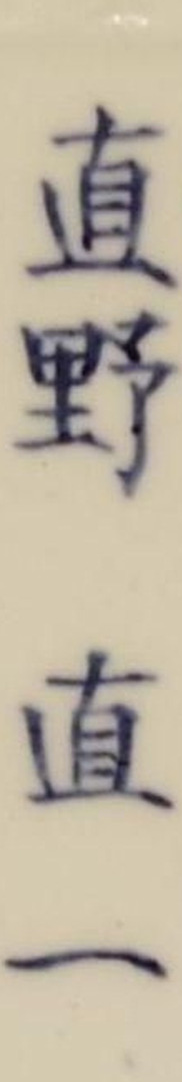直野直一
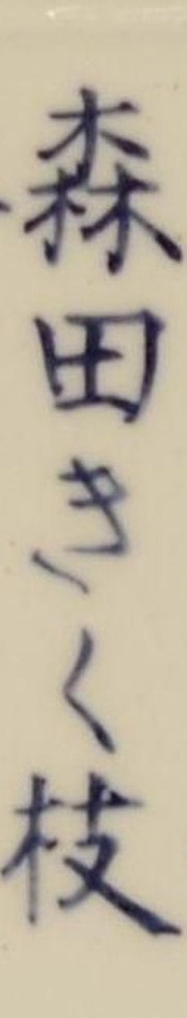森田きく枝
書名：E~L
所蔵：高野山金剛峯寺
